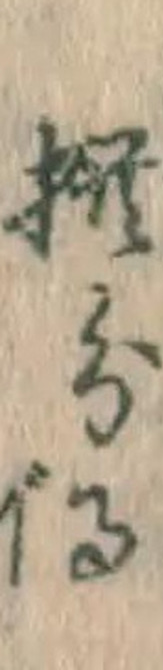撰分る
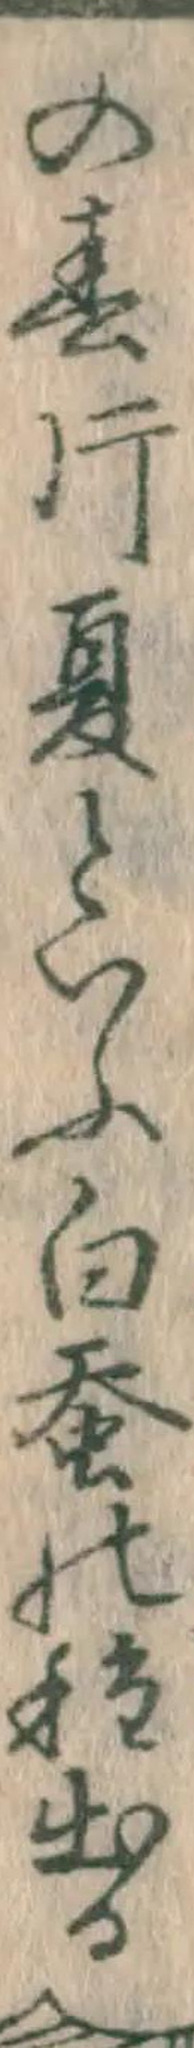の春片夏といふ白蚕の種出る
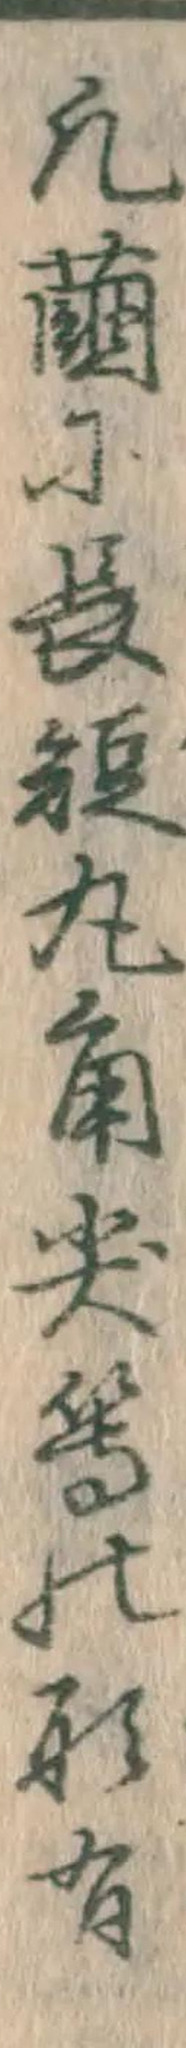凡繭に長短丸角尖等の形有
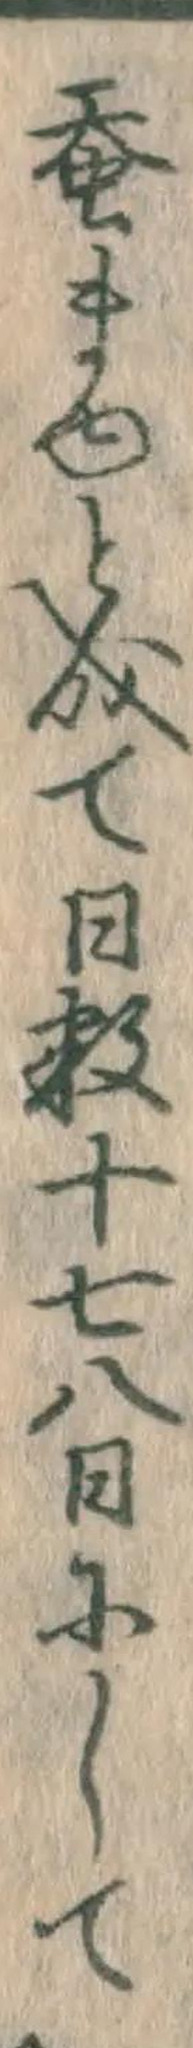蚕まゆと成て日数十七八日にして
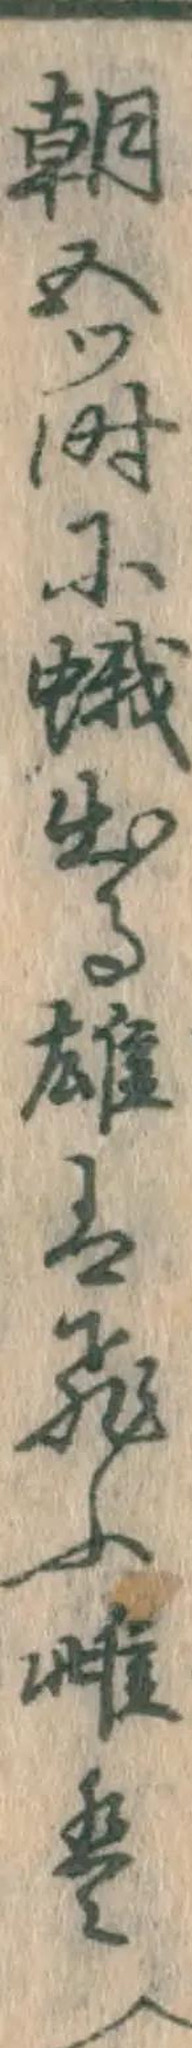朝五ッ時に蛾出る雄は飛ふ雌は
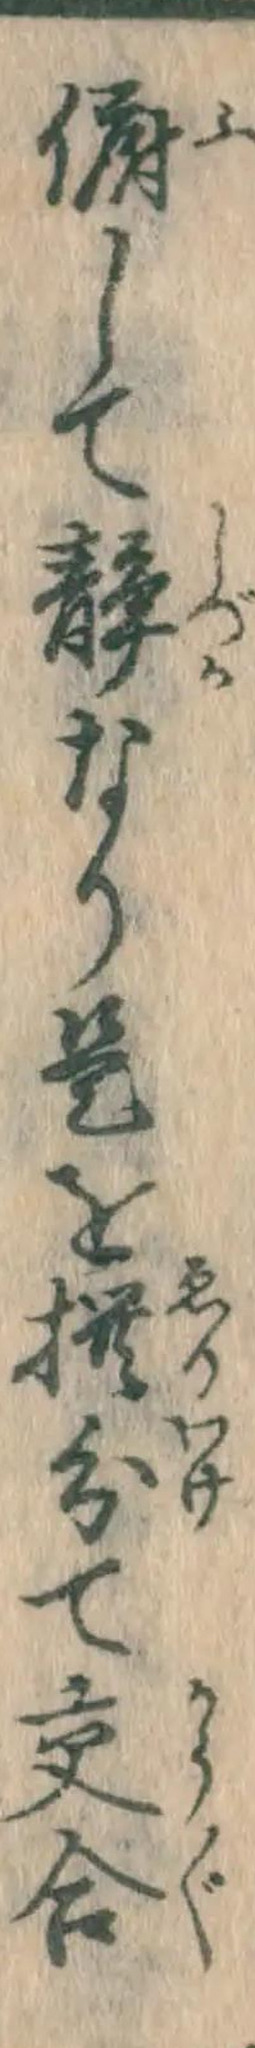俯して静なり是を撰分て交合

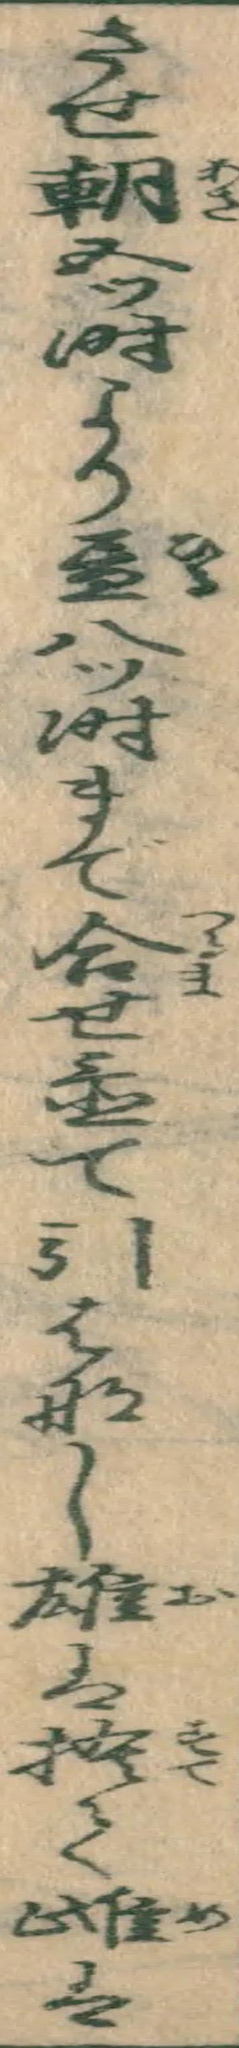させ朝五ッ時より昼八ッ時まで合せ置て引はなし雄は捨て雌は
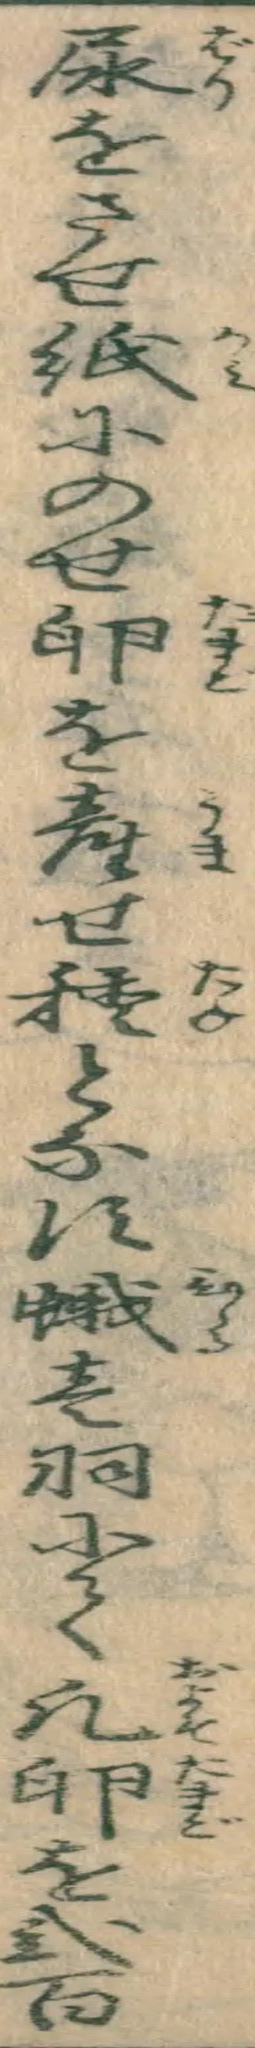尿をさせ紙にのせ卵を産せ種となす蛾壱羽にて凡卵を弐百
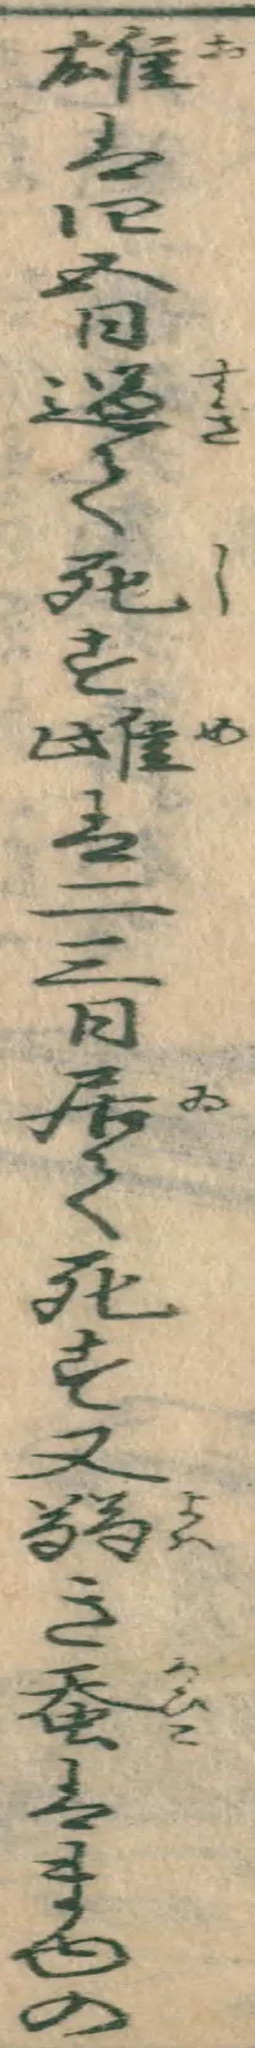雄は四五日過て死す雌は二三日居て死す又弱き蚕はまゆの
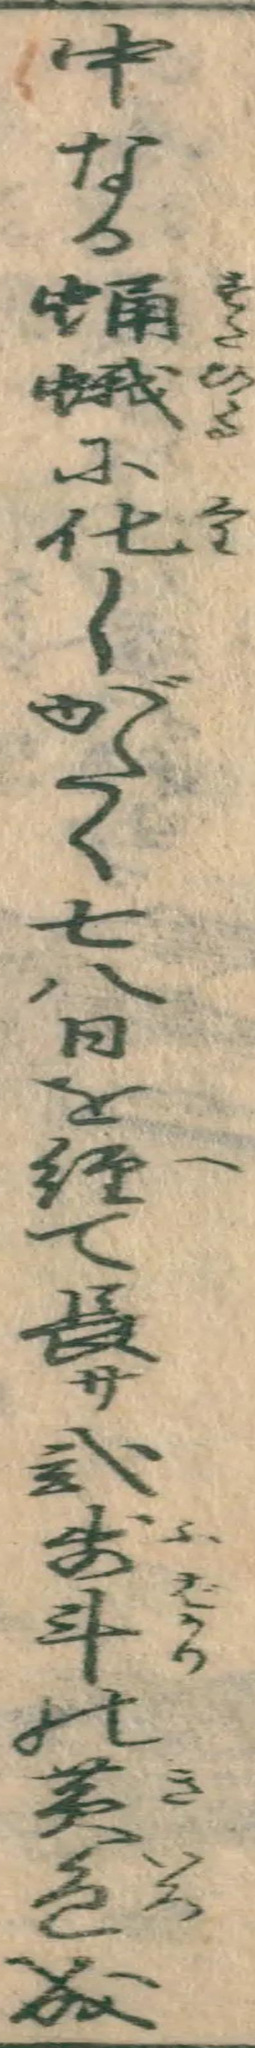中なる蛹蛾に化しがたく七八日を経て長さ弐歩斗の黄色成
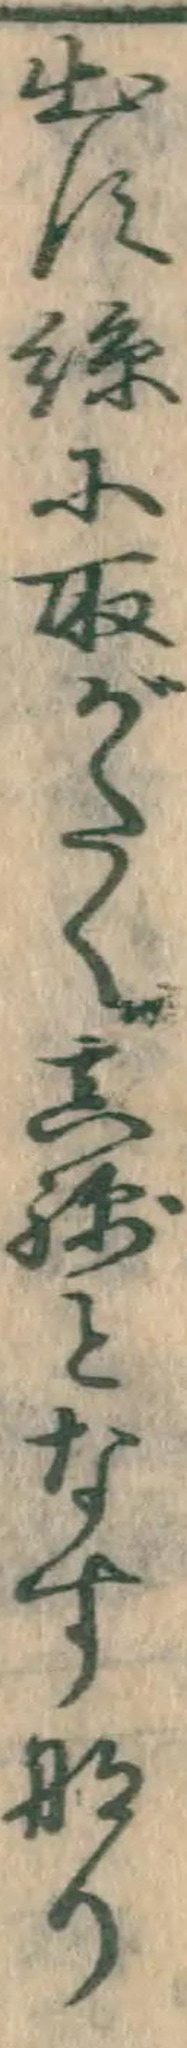出す糸に取がたく真綿となすなり
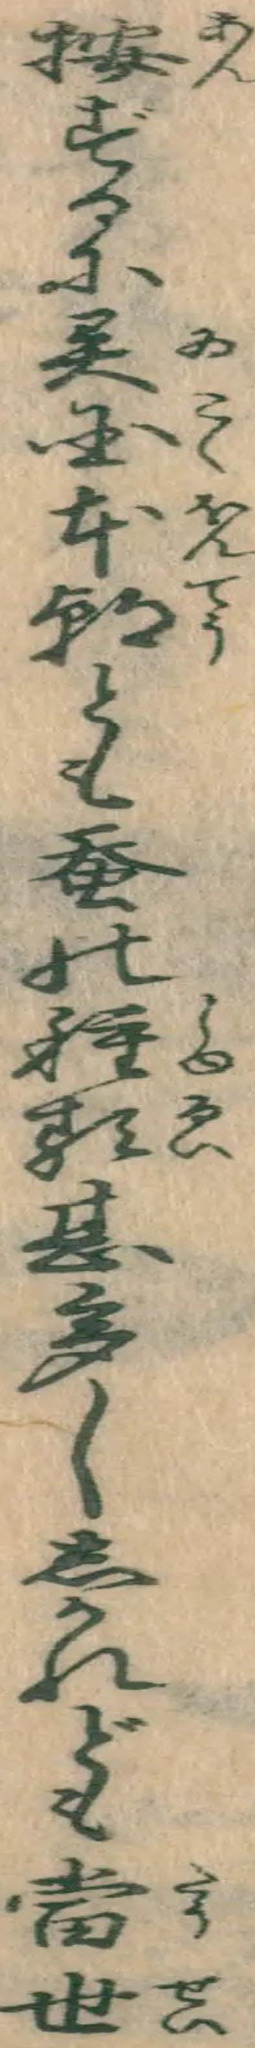按ずるに異国本朝とも蚕の種類甚多ししかれども当世
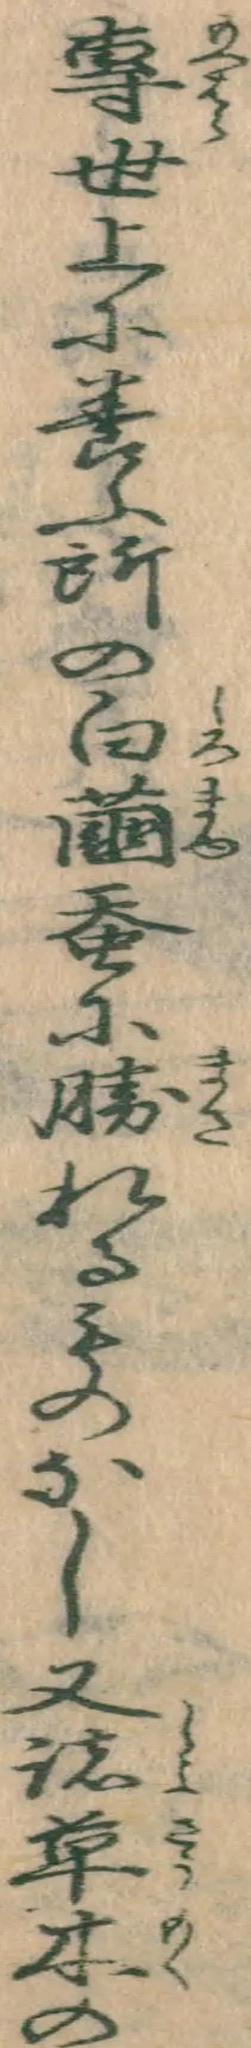専世上に養ふ所の白繭蚕に勝れるものなし又諸草木の
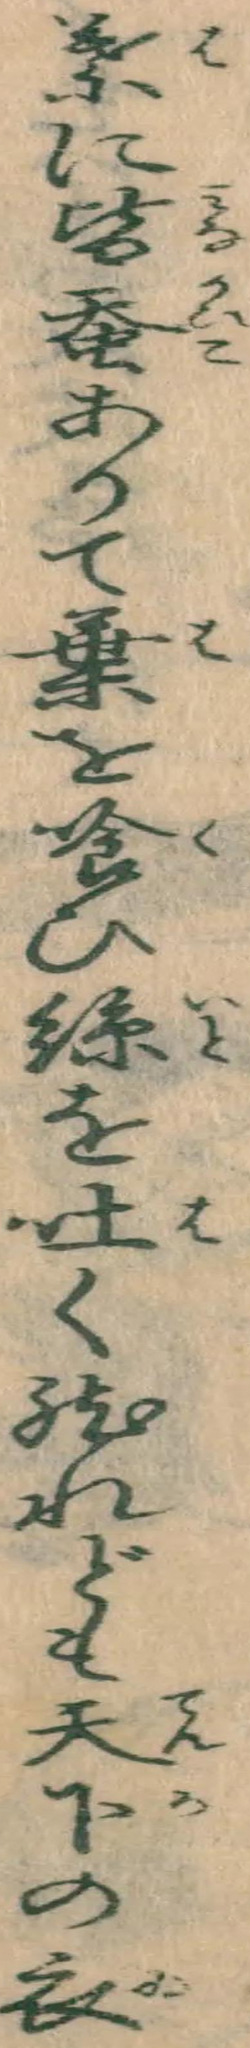葉に皆蚕ありて葉を喰ひ糸を吐く然れども天下の衣
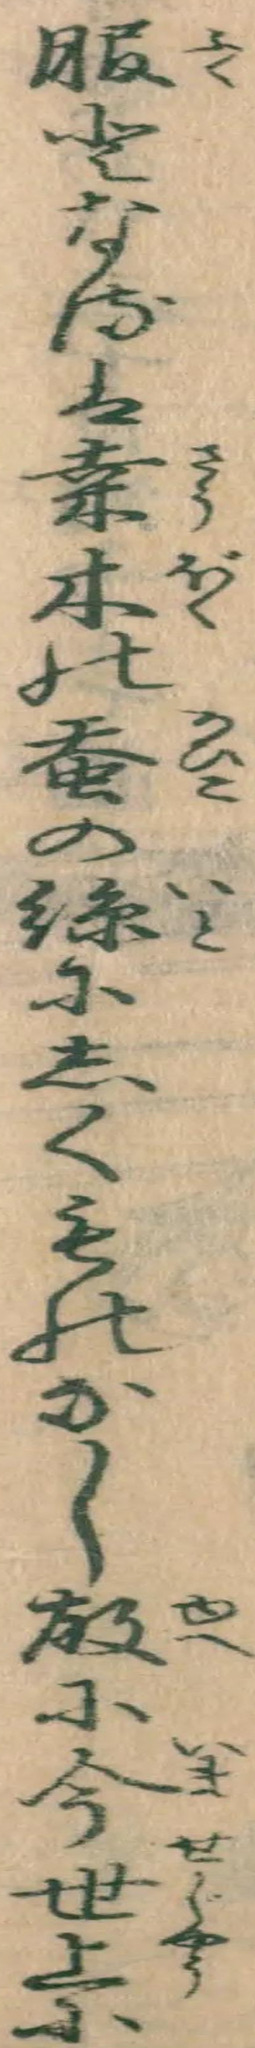服となるは桑木の蚕の糸にしくものなし故に今世上に
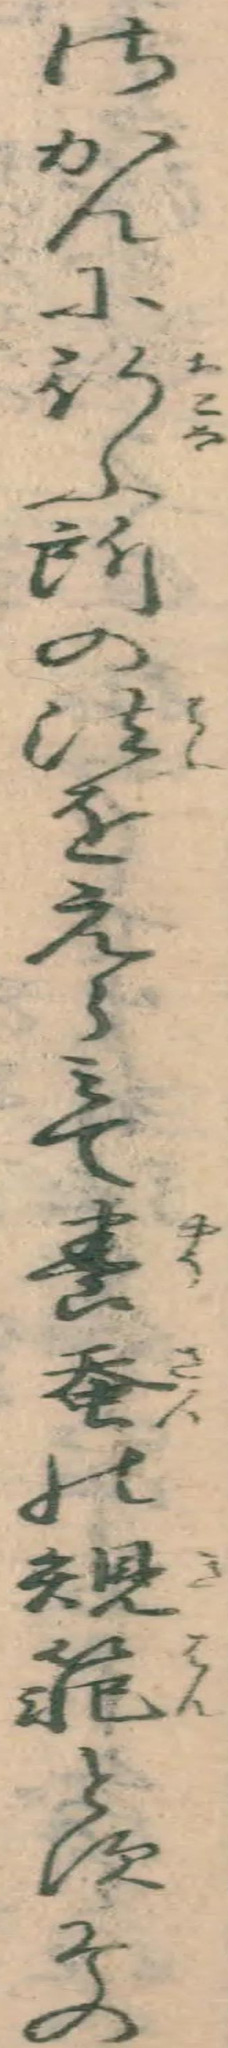さかんに行ふ所の法をえらみて養蚕の規範とすその
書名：養蚕秘録 3巻. [1]
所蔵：国立国会図書館 National Diet Library, JAPAN
